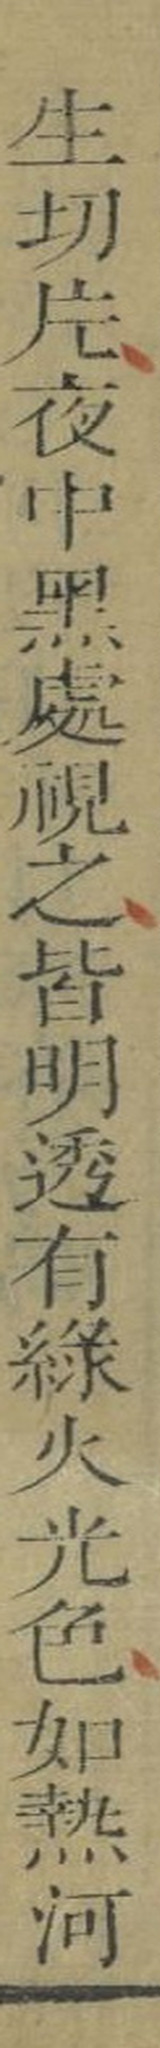生切片夜中黒処視之皆明透有緑火光色如熱河
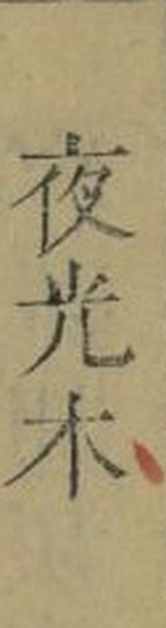夜光木
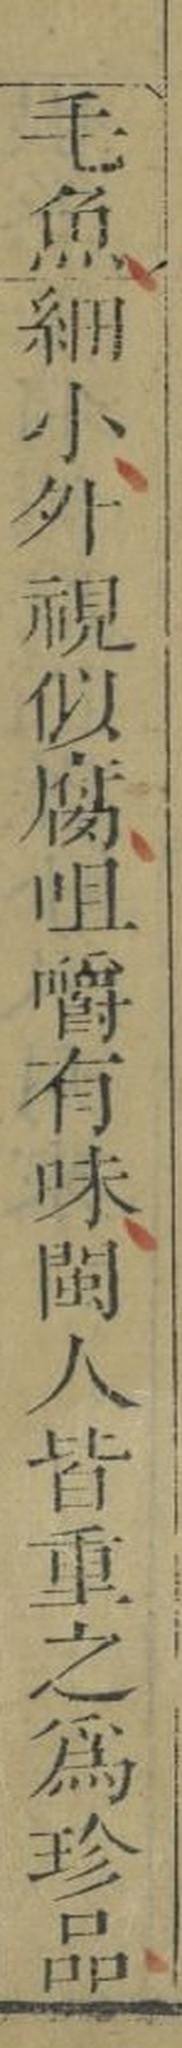[毛魚]細小外視似腐咀嚼有味閩人皆重之為珍品
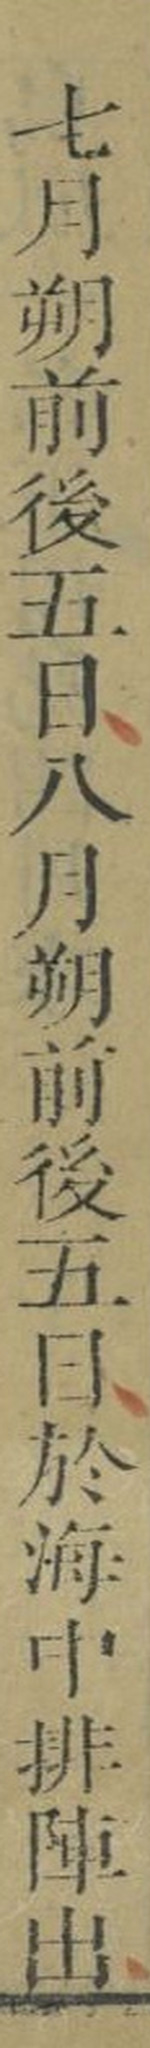七月朔前後五日八月朔前後五日於海中排陣出
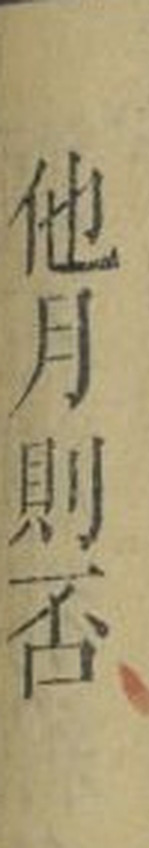他月則否
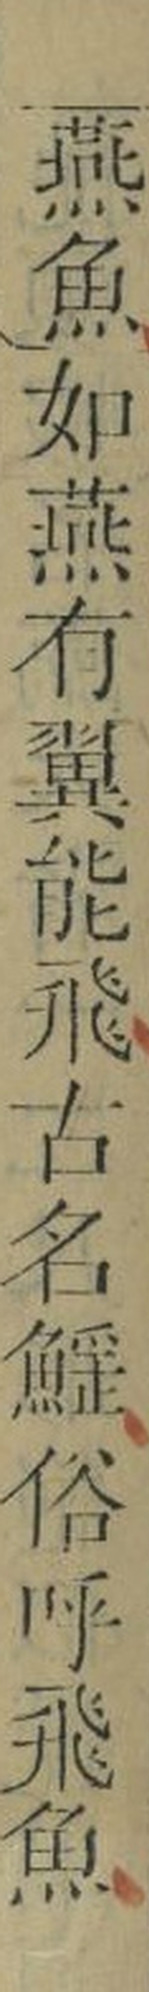[燕魚]如燕有翼能飛古名鳐俗呼飛魚
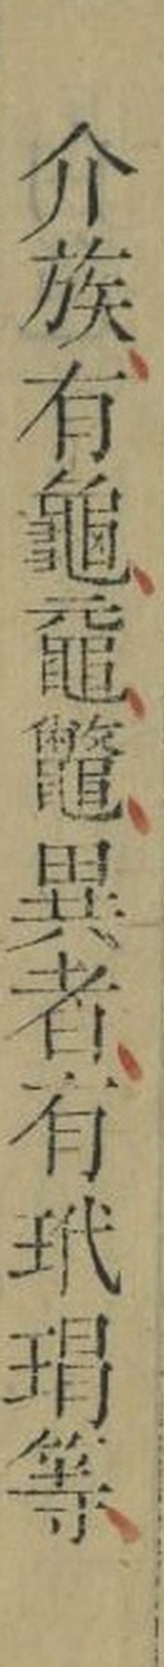介族有亀黿鼈異者有玳瑁等
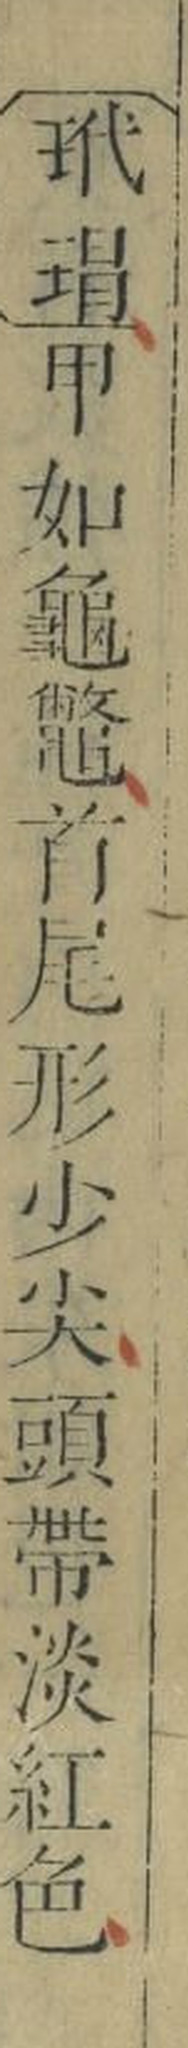[玳瑁]甲如亀鼈首尾形少尖頭帯淡紅色
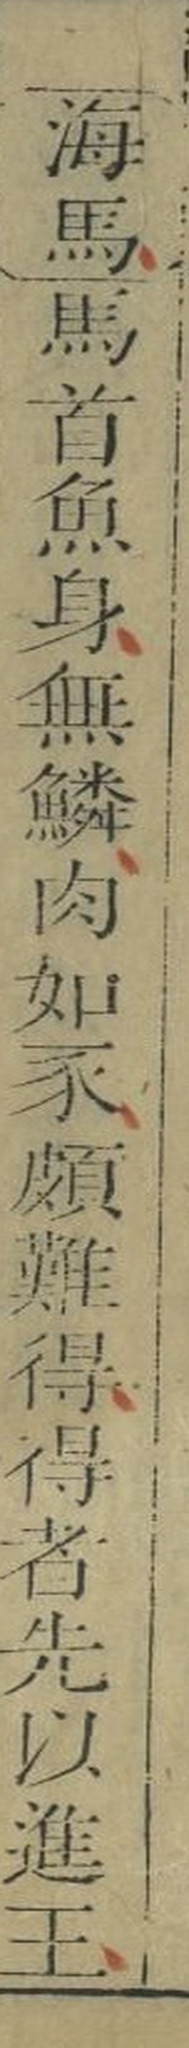[海馬]馬首魚身無鱗肉如豕頗難得得者先以進王
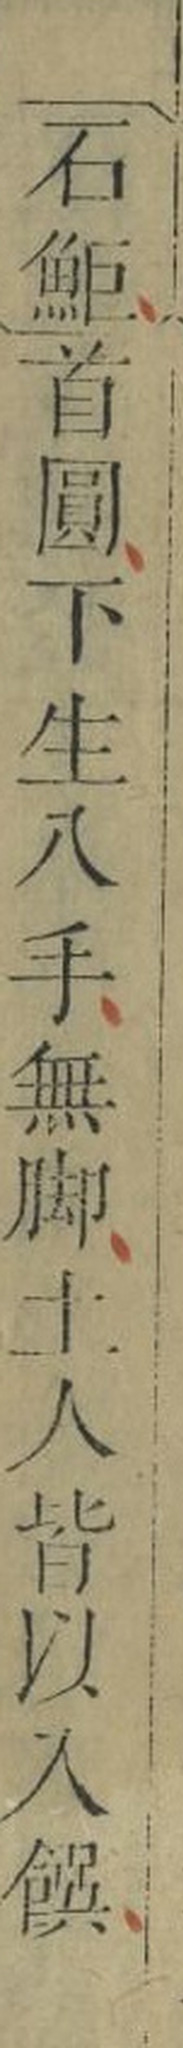[石鮔]首円下生八手無脚土人皆以入饌
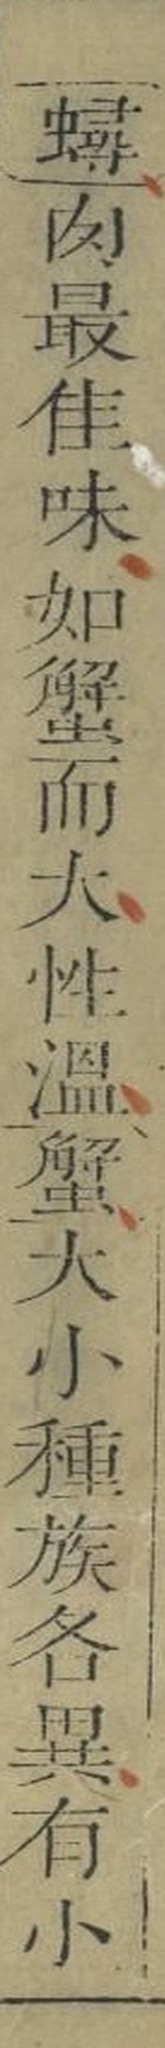[蟳]肉最佳味如蟹而大性温[蟹]大小種族各異有小
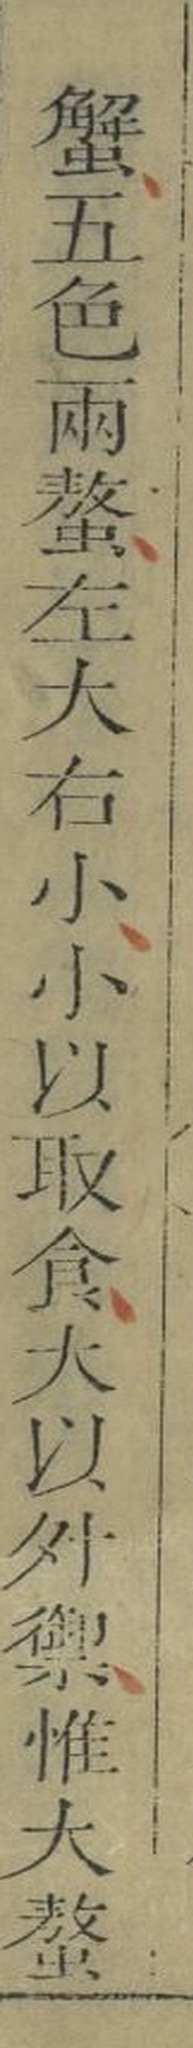蟹五色両螯左大右小小以取食大以外禦惟大螯
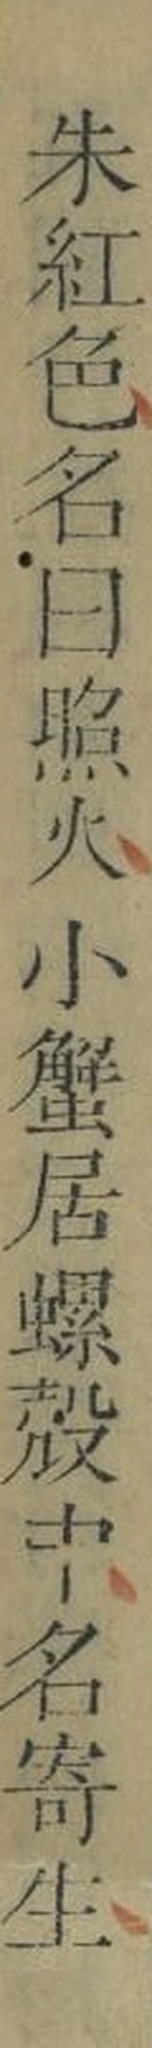朱紅色名曰照火小蟹居螺殻中名寄生

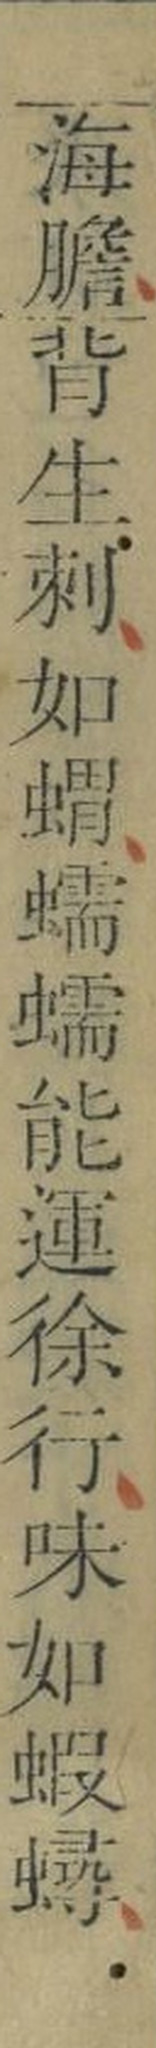[海胆]背生刺如蝟蠕蠕能運徐行味如蝦蟳
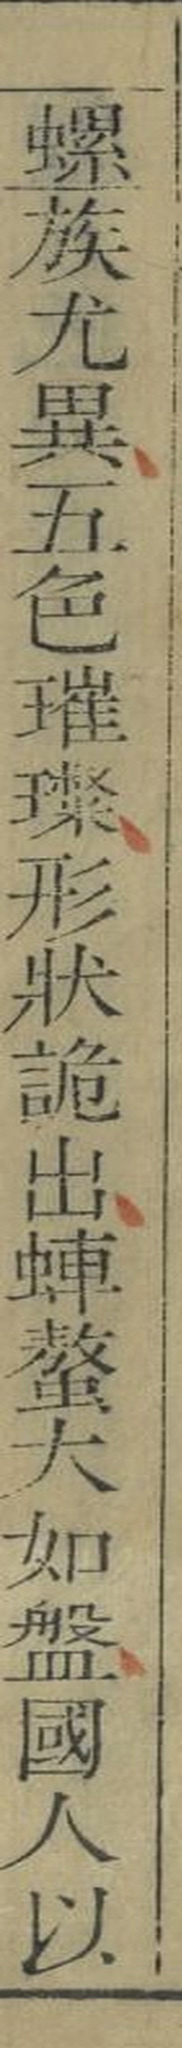[螺]族尤異五色璀璨形状詭出蛼螯大如盤国人以
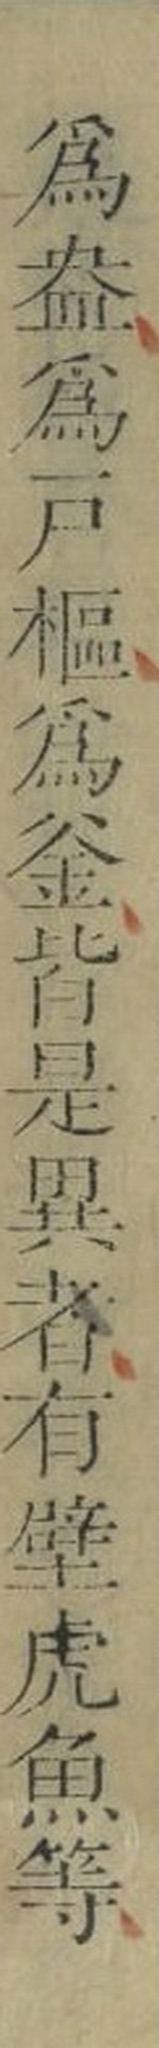為盎為戸枢為釜皆是異者有壁虎魚等
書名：中山伝信録 巻六
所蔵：University of the Ryukyus Library
